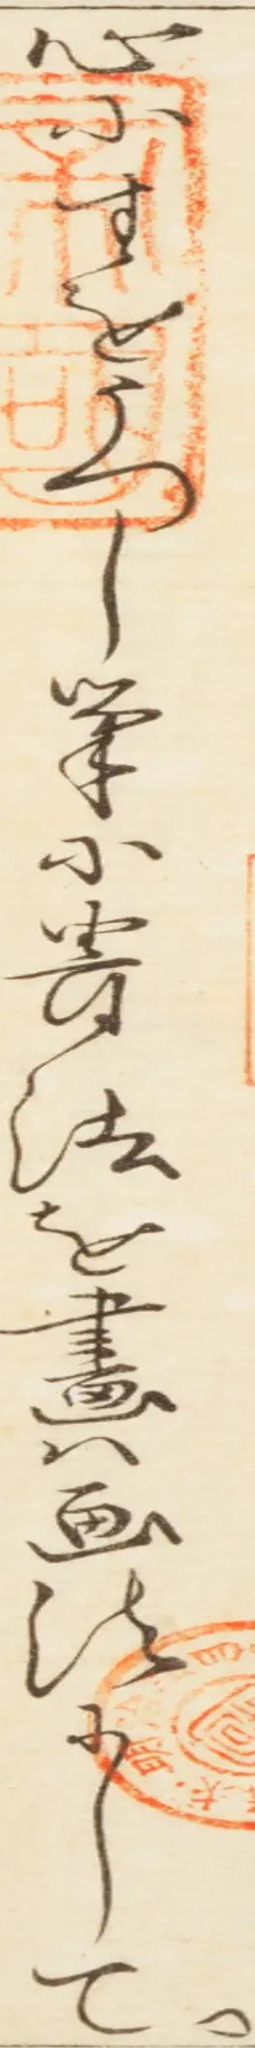心に生をうつし筆に骨法を画は画法にして。
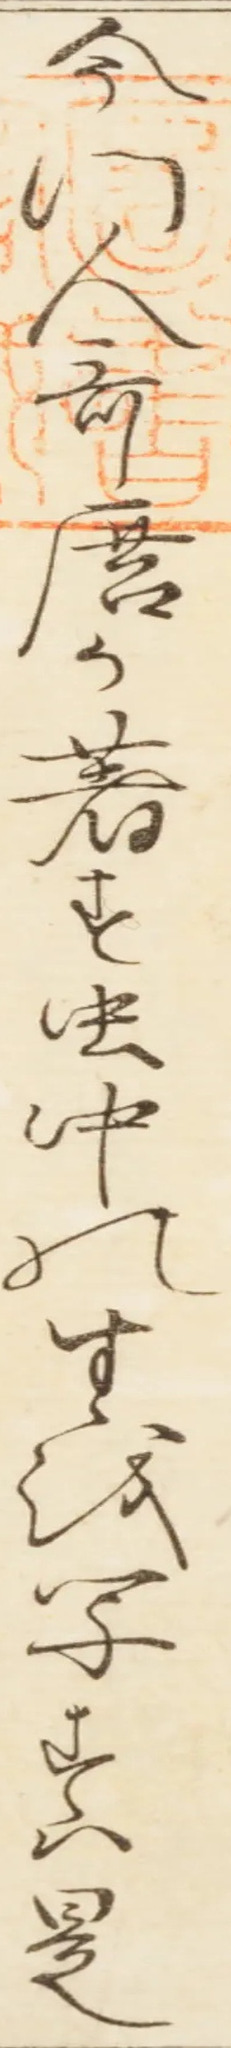今門人哥麿か著す虫中の生を写すは是
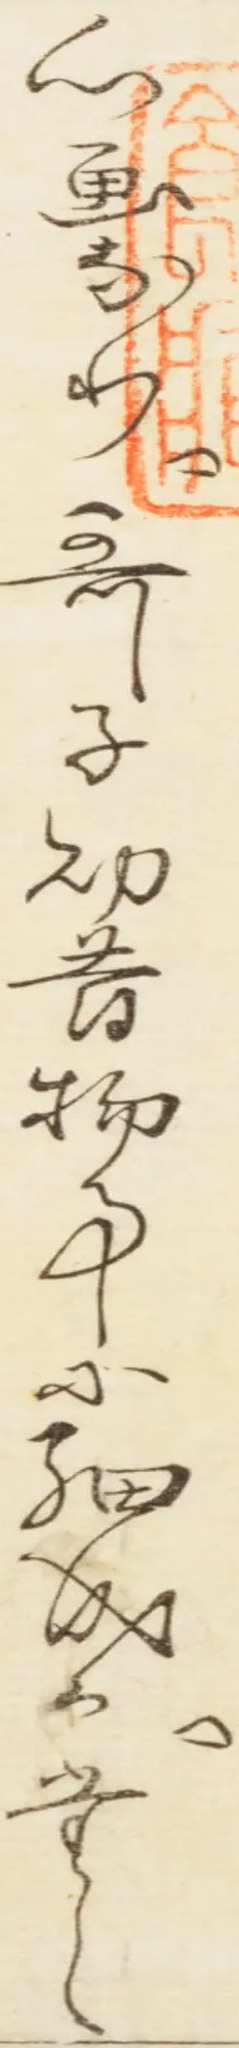心画なり。哥子幼昔物事に細成か。たゝ
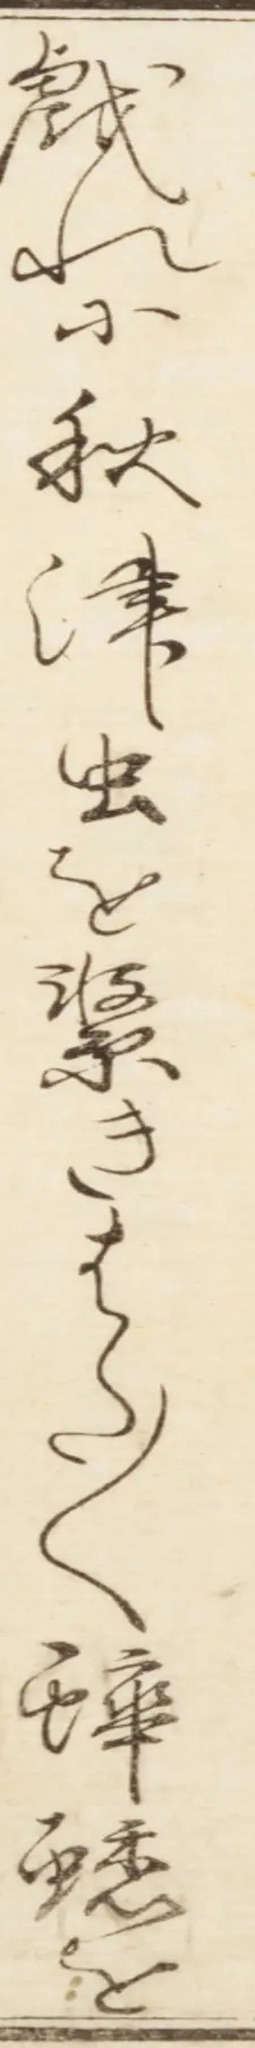戯れに秋津虫を繋きはた〳〵蟀蟋を
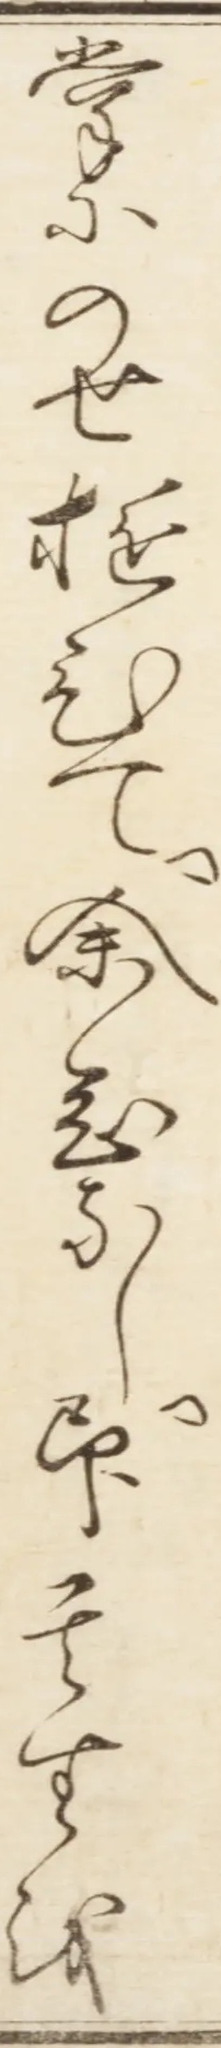掌にのせ遊ひて。余念なし。即其生を
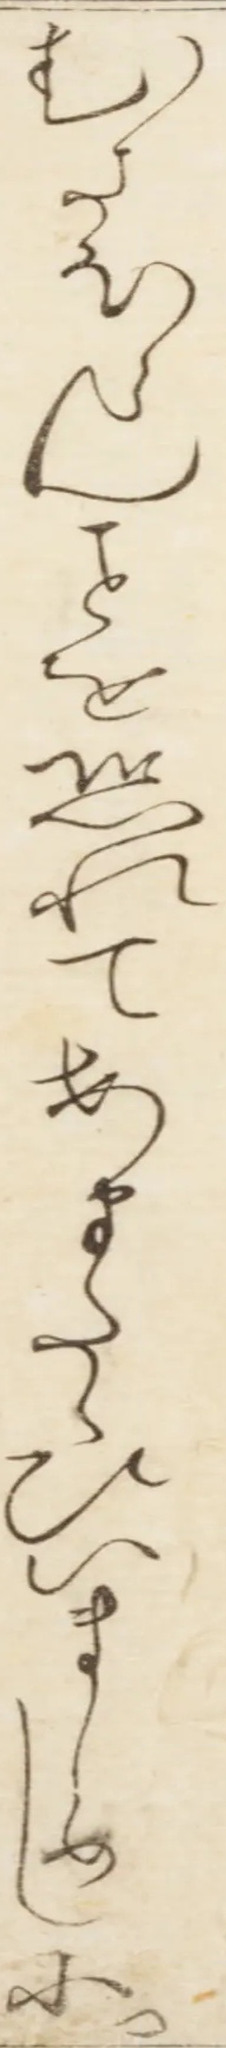むさほらんことを恐れてあまたゝひいましめしに。
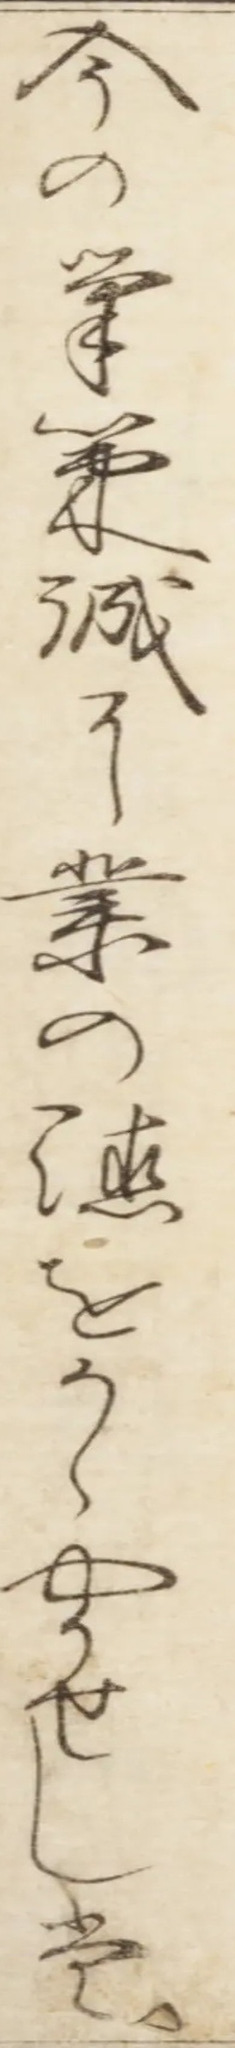今の筆策誠に業の徳をかゝやかせしは。

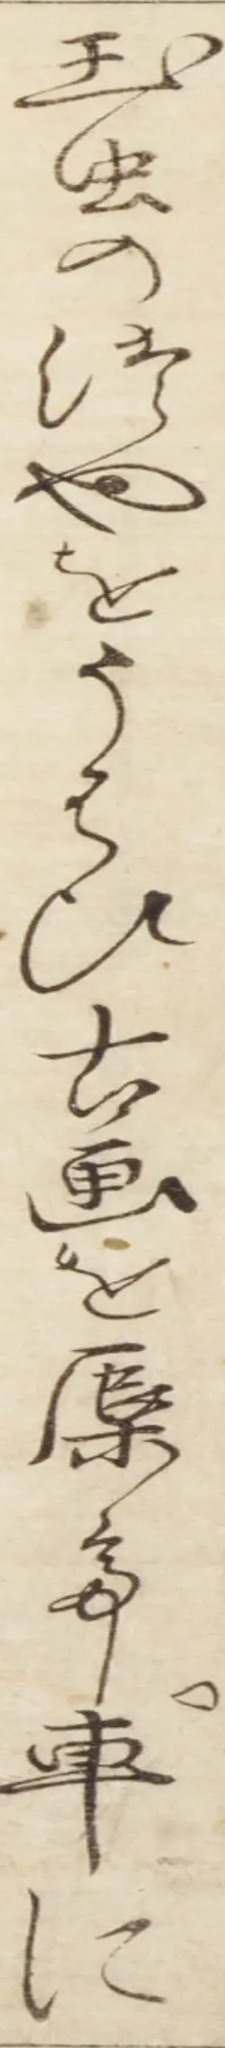玉虫のつやをうはひ古画を辱て。車に
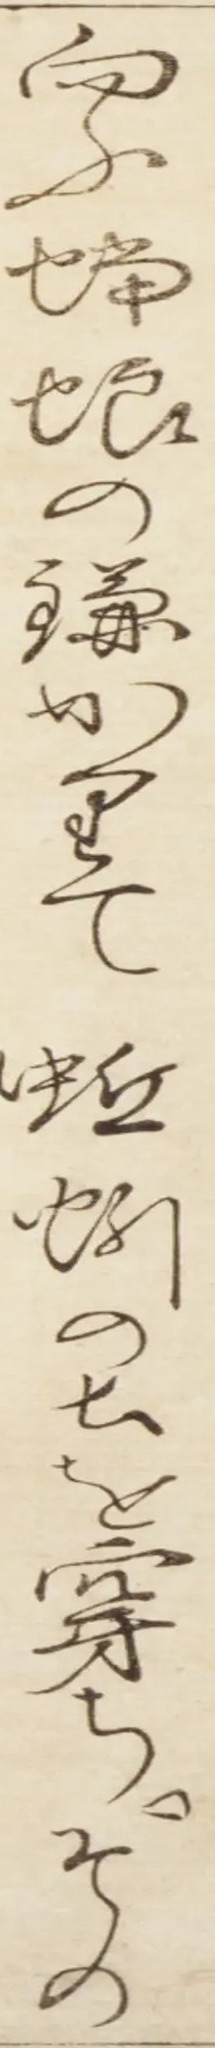向ふ蟷螂の鎌かりて蚯蚓の土を穿ち。その
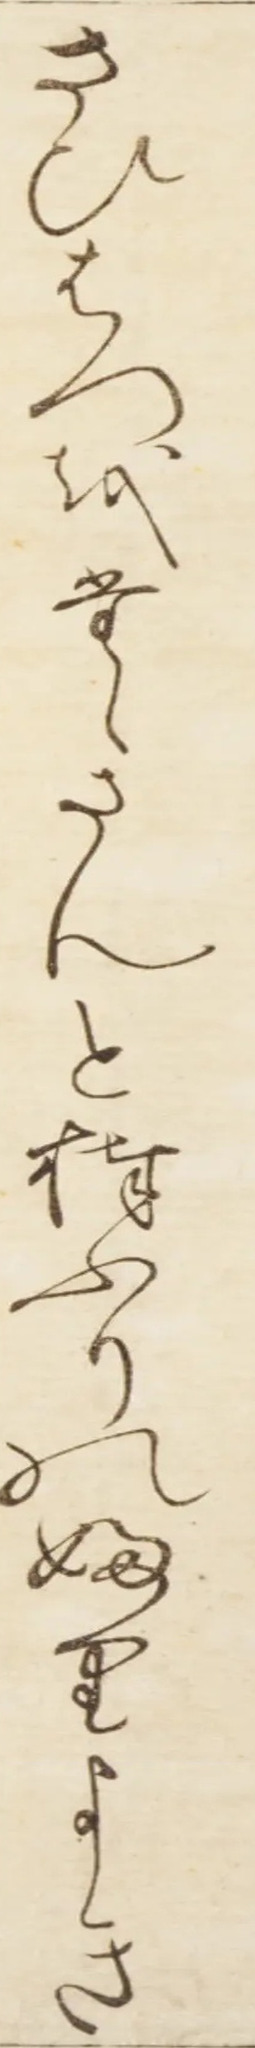さひはつをたゝさんと棒ふりのふりよき
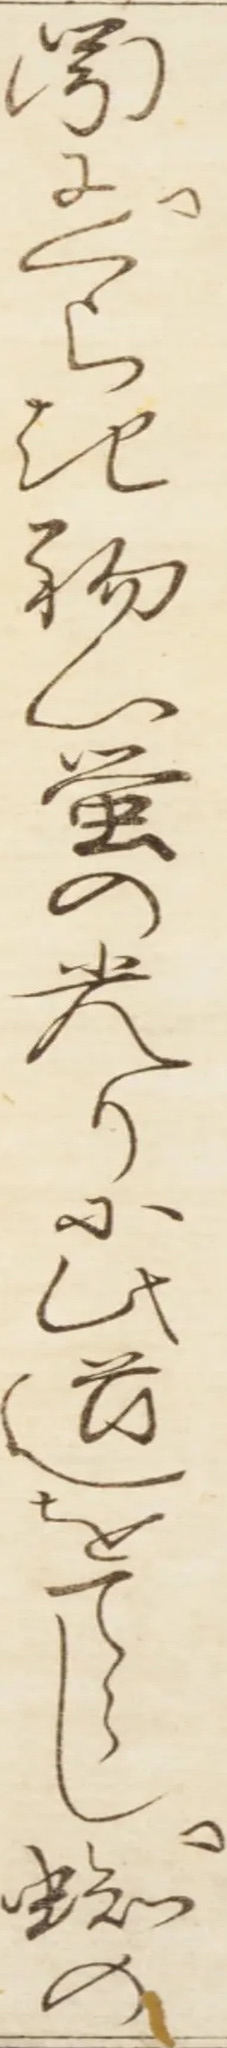図に。くらき物心蛍の光りに此道をてらし。蜘の
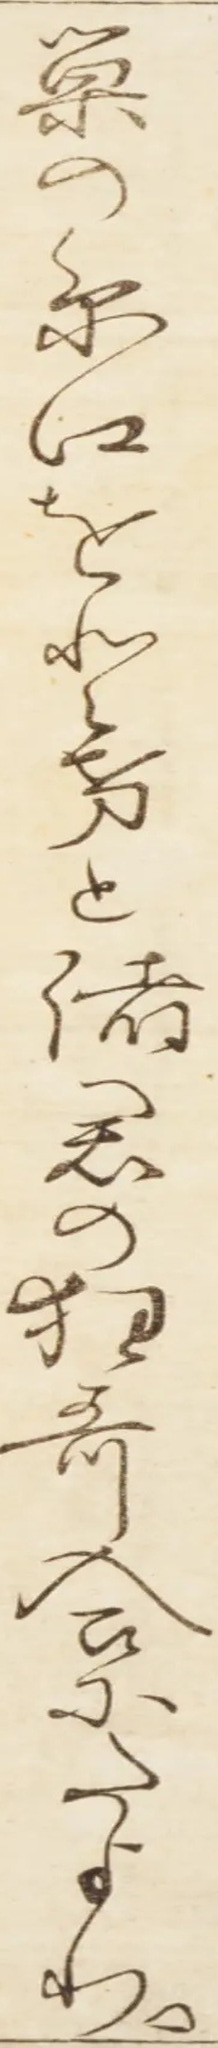巣の糸口をとけと諸君の狂哥合にたより。
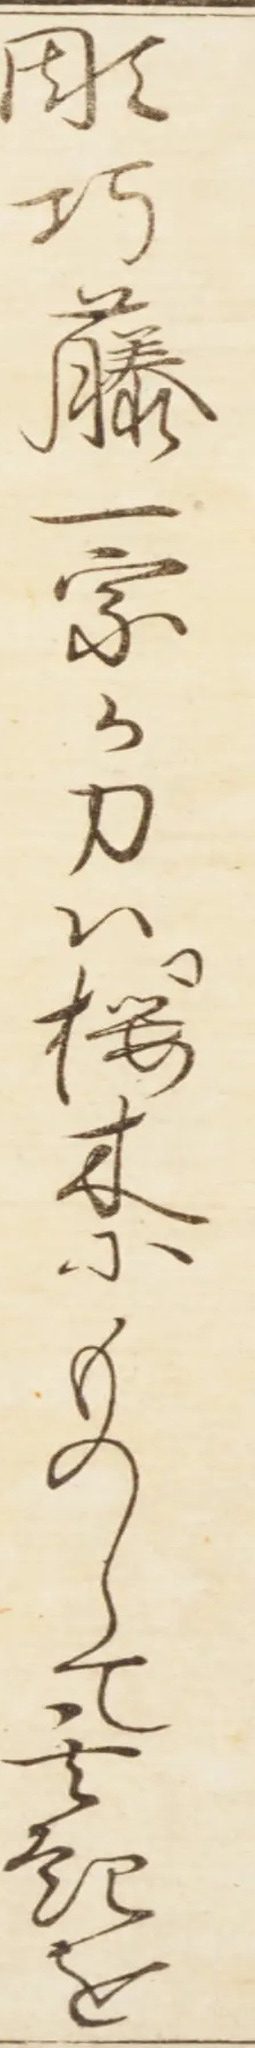彫巧藤一宗か刀は。桜木にものして其起を
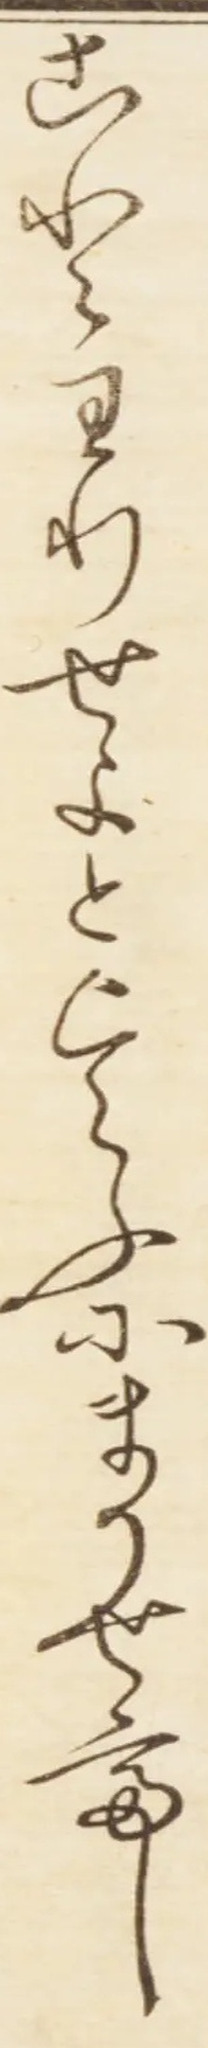ことわりせよと乞ふにまかせて
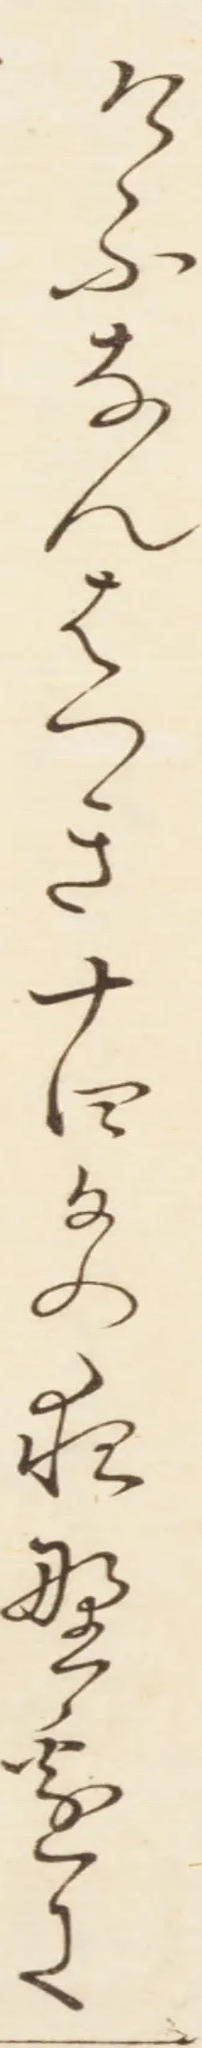けふなんはつき十四日の夜野辺に
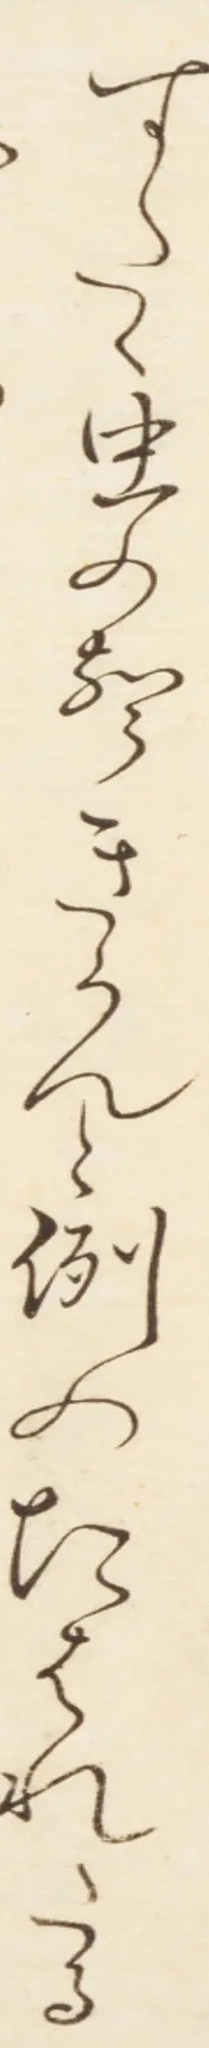すたく虫の声きかんと例のたはれたる
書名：画本虫ゑらみ
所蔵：国立国会図書館 National Diet Library, JAPAN
